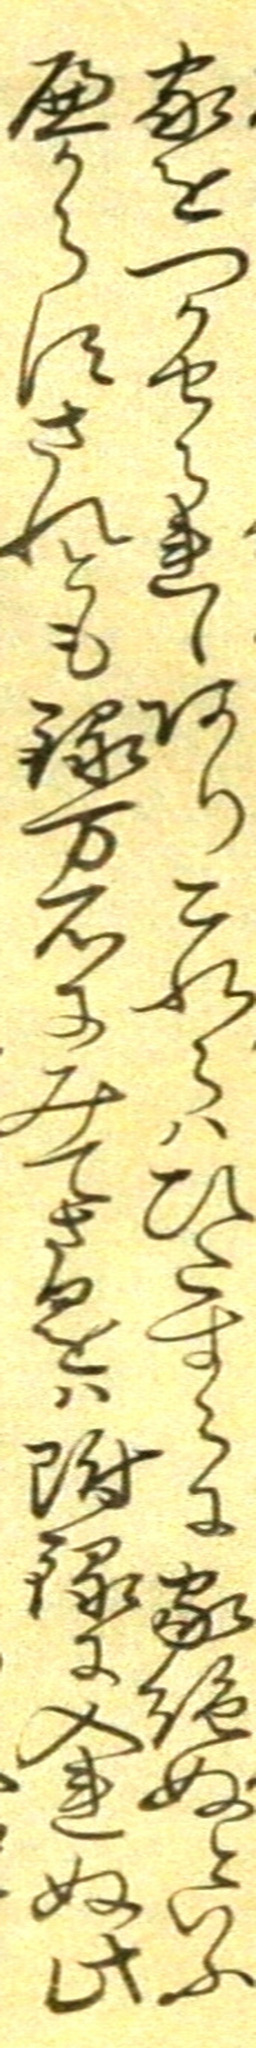へからすされとも録万石にみてさるをは附録に入れぬ此
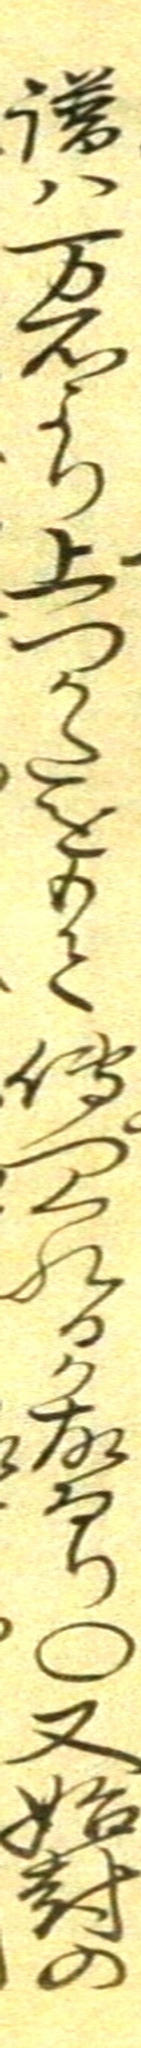譜は万石より上つかたをもて伝つくれるか故なり○又始封の
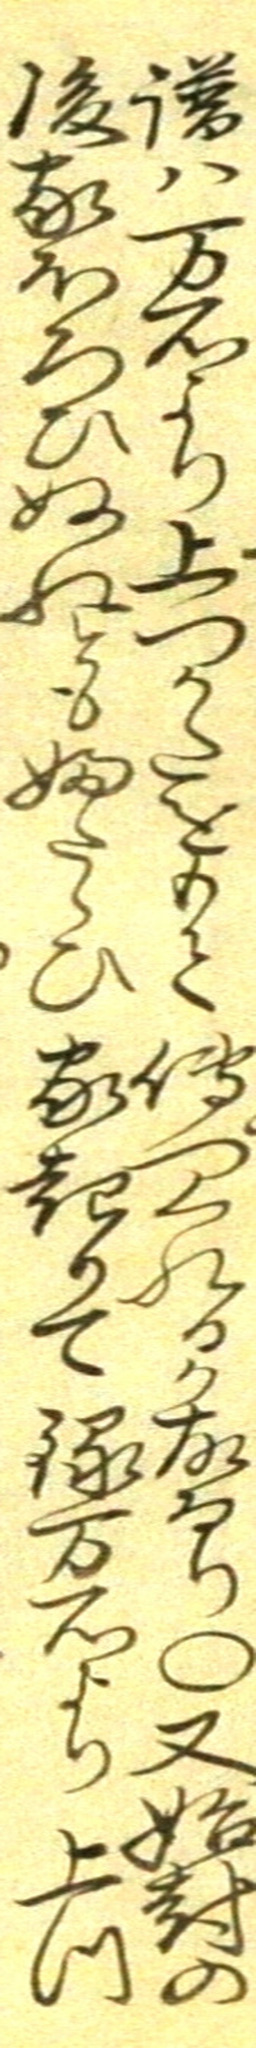後家ほろひぬれともふたゝひ家起りて録万石より上つ
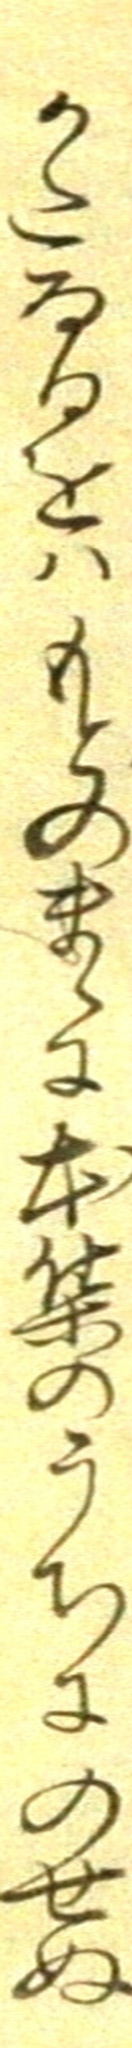かたなるをはもとのまゝに本集のうちにのせぬ
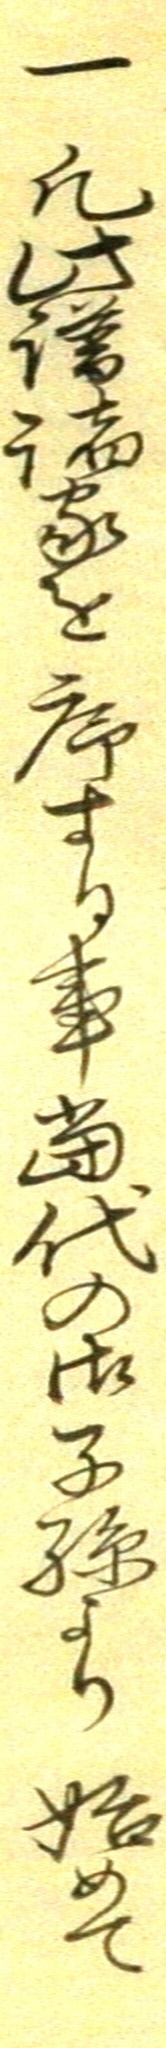一凡此譜諸家を序する事当代の御子孫より始めて
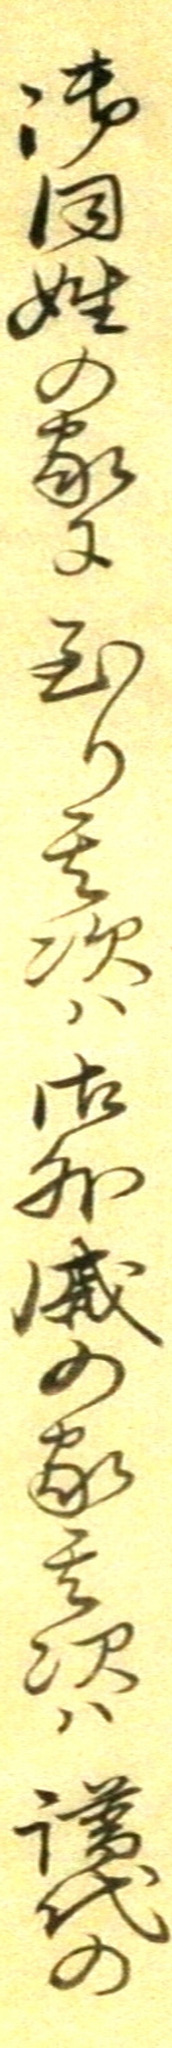御同姓の家に至り其次は御外戚の家其次は譜代の
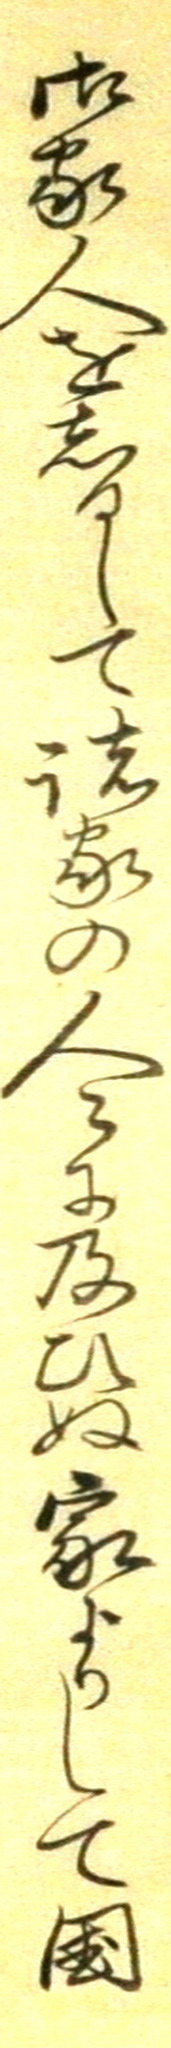御家人をしるして諸家の人々に及ひぬ家よりして国
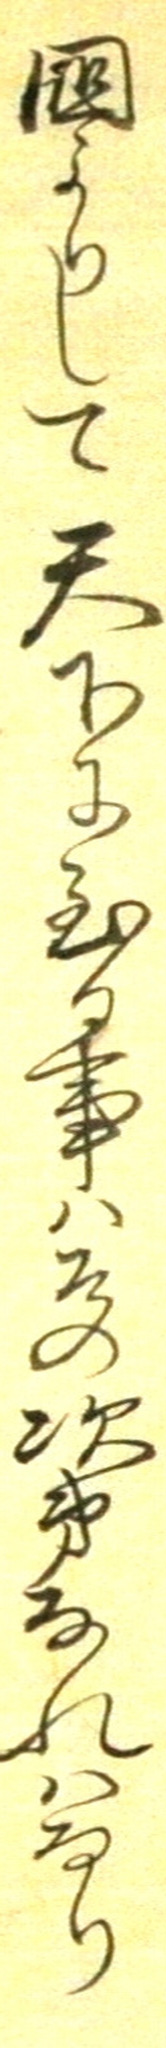国よりして天下に至る事はその次第なれはなり
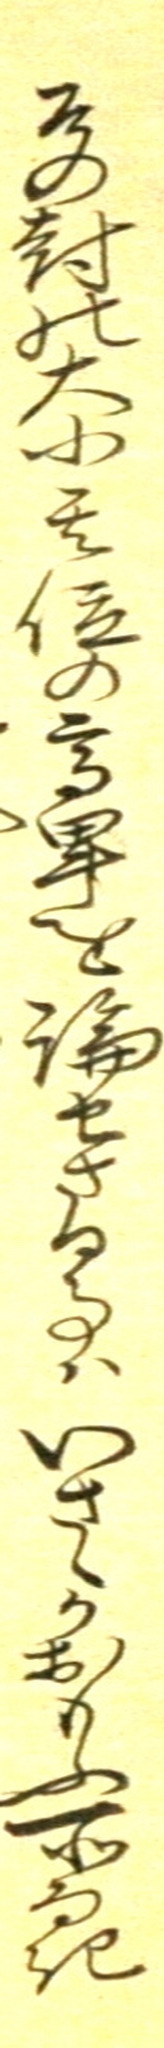その封の大小其位の高卑を論せさる事はいさゝかおもふ所なき
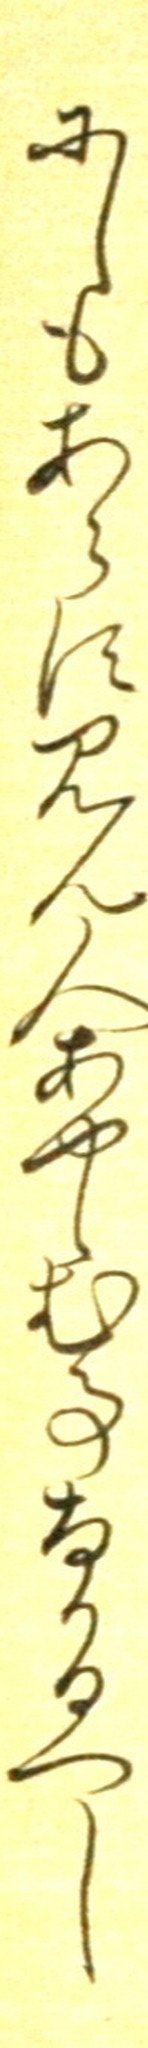にしもあらす見ん人あやしむ事なかるへし
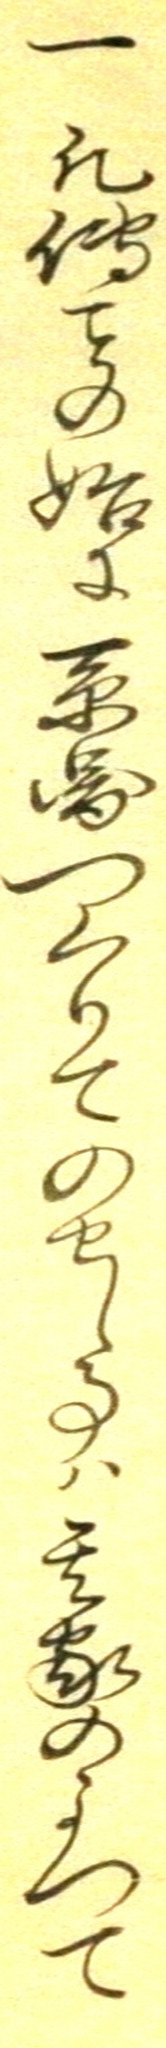一凡伝ことの始に系図つくりてのせし事は其家のよつて
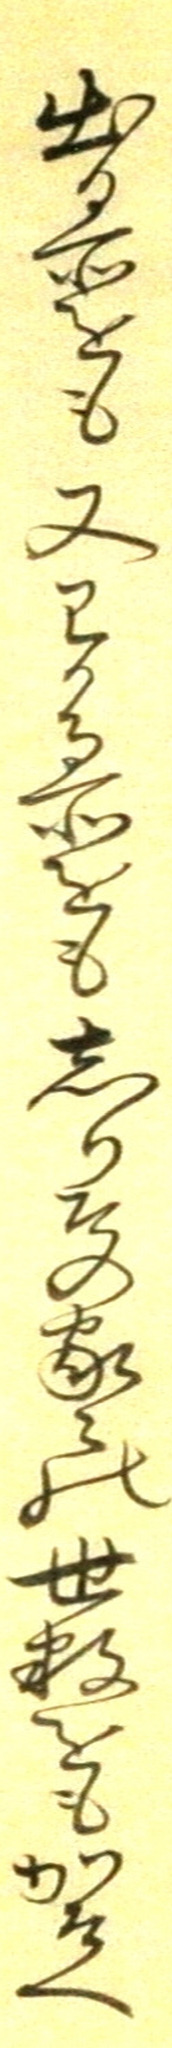出る所をも又わかる所をもしりその家々の世数をもかそへ
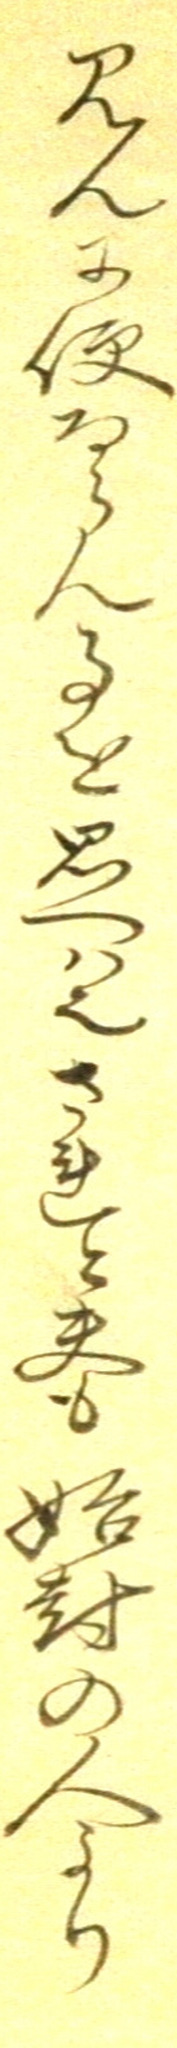見んに便ならん事を思へは也されと夫も始封の人より
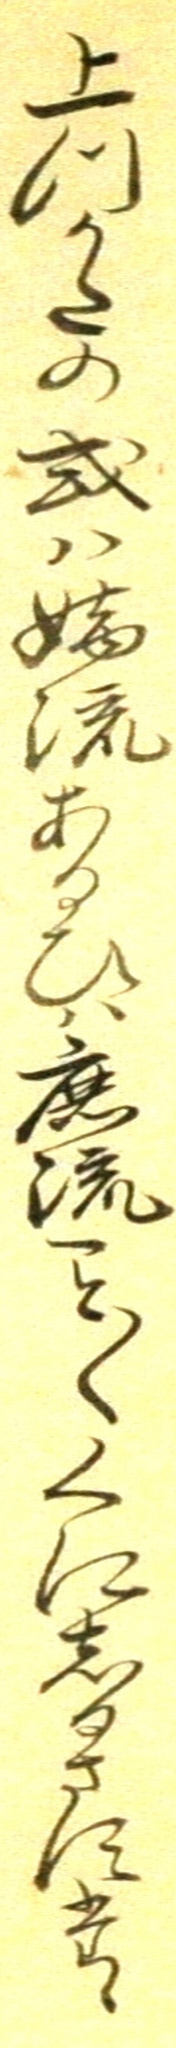上つかたの或は嫡流あるひは庶流こと〳〵くにしるさすたゝ
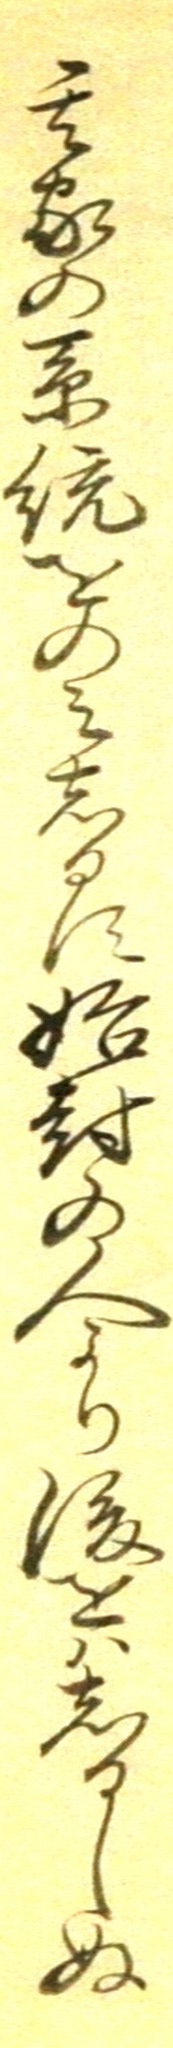其家の系統をのみしるす始封の人より後をはしるしぬ
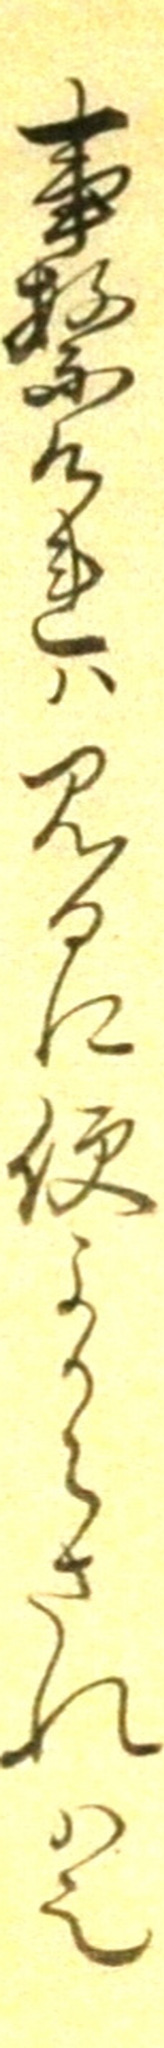事繁けれは見るに便よからされは也
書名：藩翰譜（一）
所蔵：伊那市立高遠町図書館・合同会社AMANE
